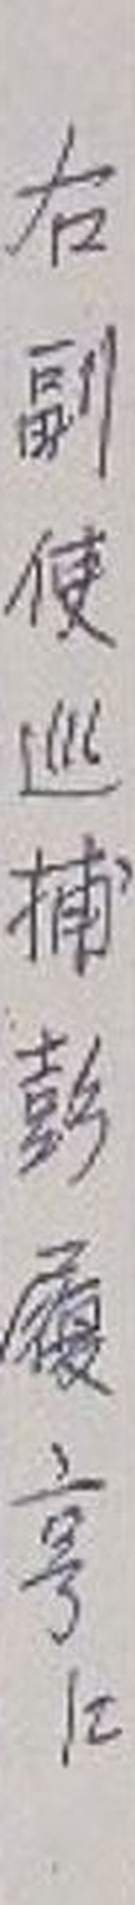右副使巡捕彭履亨え
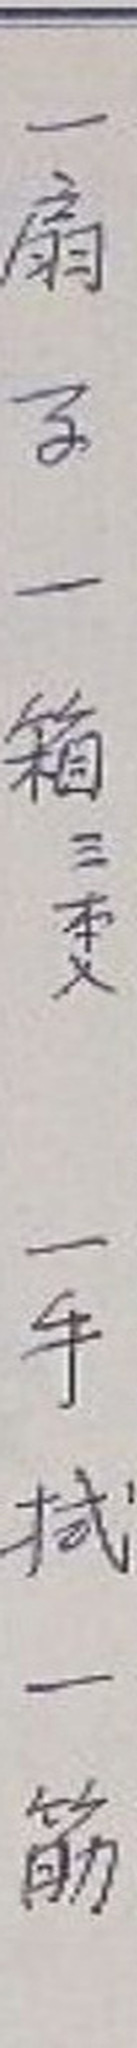一扇子一箱三本入一手拭一筋
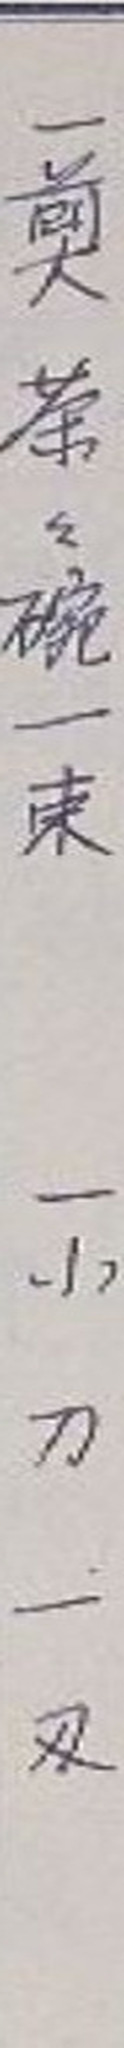一煎茶茶碗一束一小刀一刃
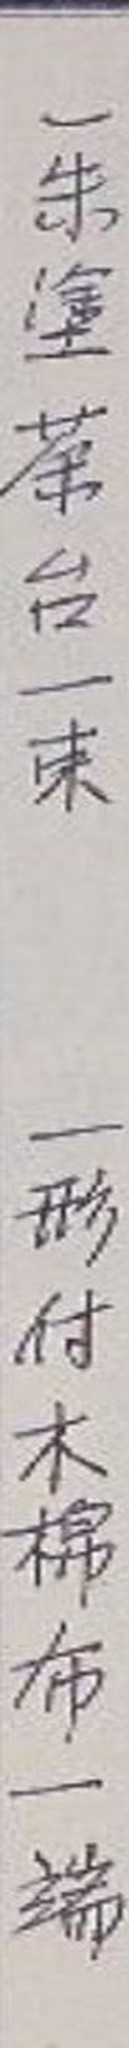一朱塗茶台一束一形付木棉布一端
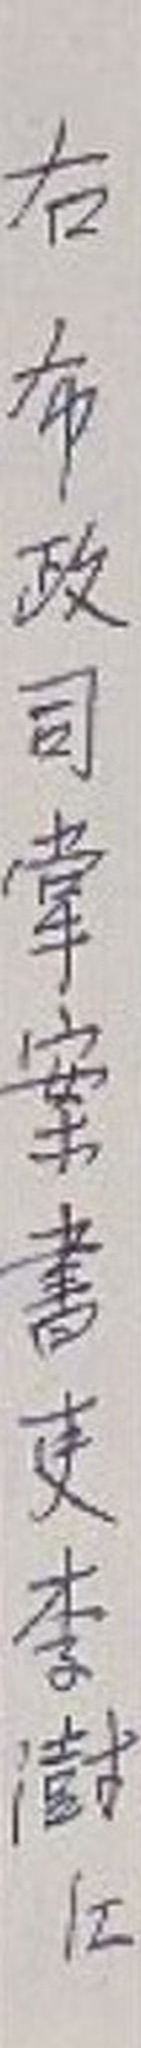右布政司掌案書吏李澍え
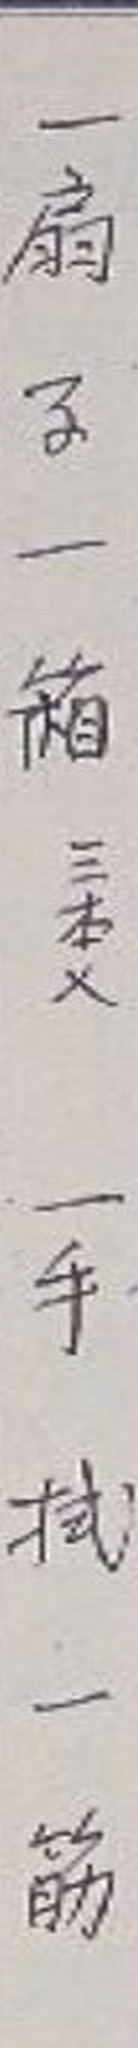一扇子一箱三本入一手拭一筋
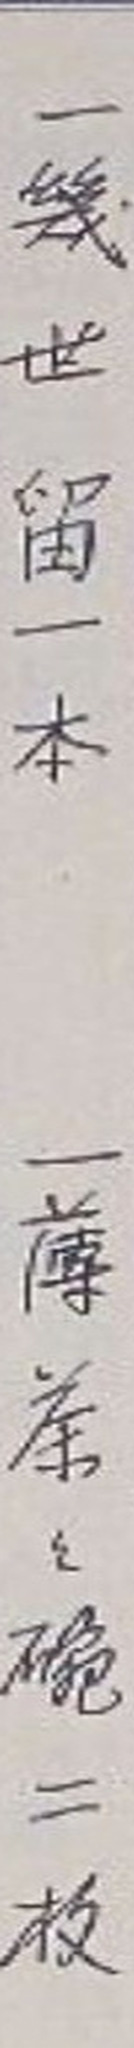一幾世留一本一薄茶々碗二枚
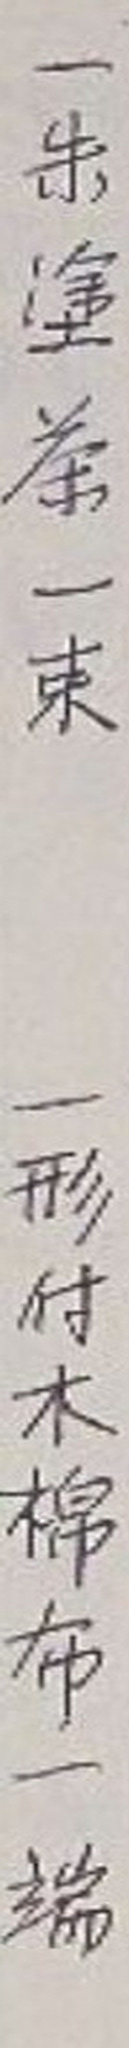一朱塗茶一束一形付木棉布一端
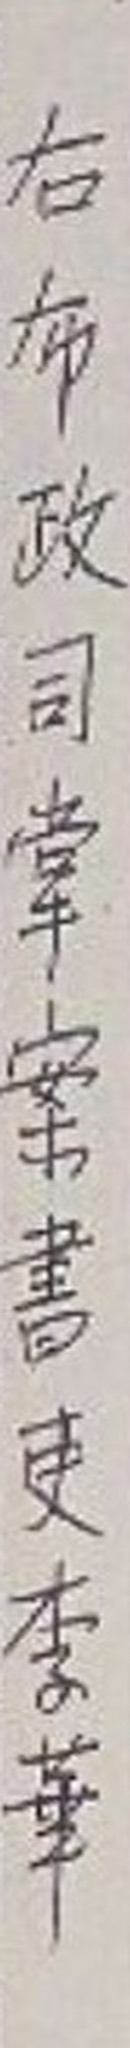右布政司掌案書吏李華
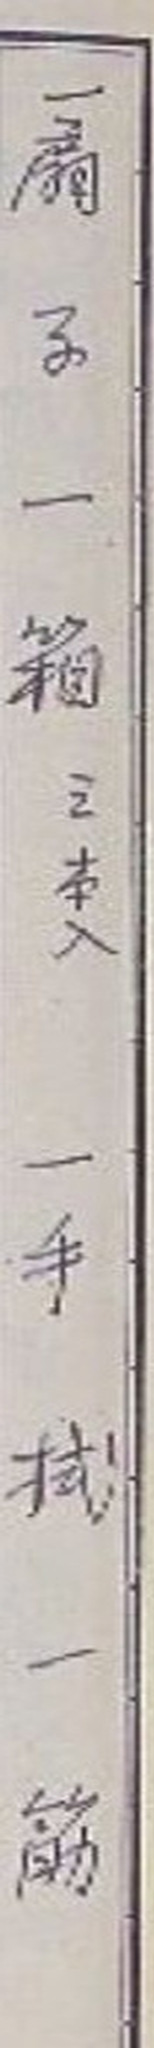一扇子一箱三本入一手拭一筋
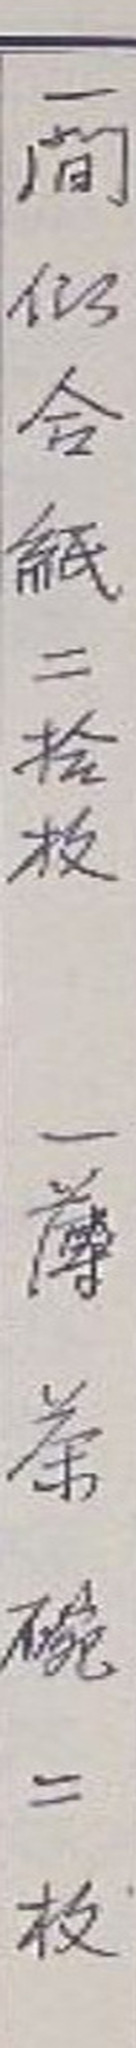一間似合紙二拾枚一薄茶碗二枚
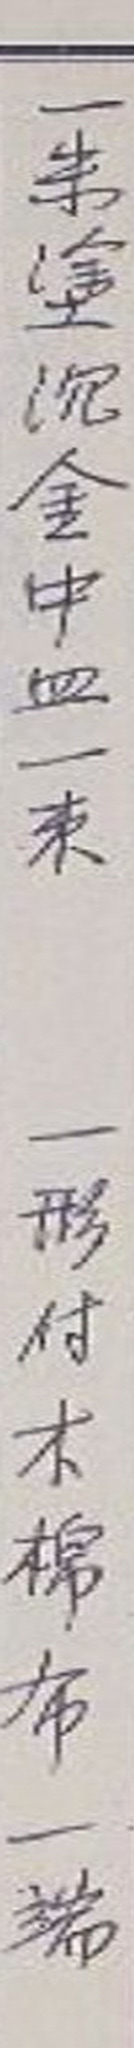一朱塗沈金中皿一束一形付木棉布一端
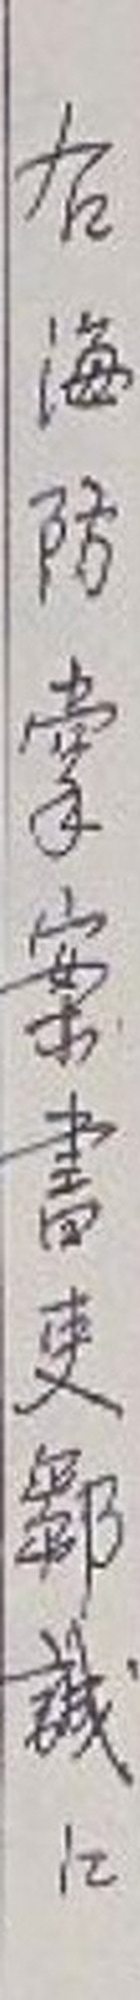右海防掌案書吏鄒誠え
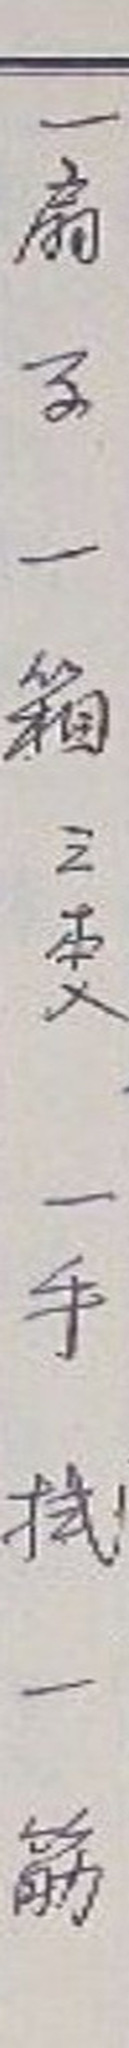一扇子一箱三本入一手拭一筋
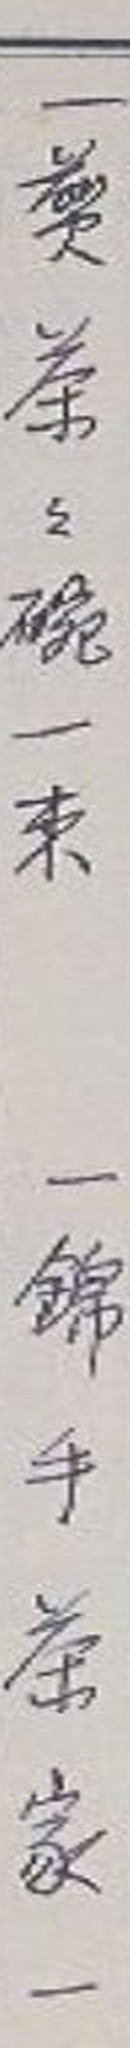一煎茶茶碗一束一錦手茶家一
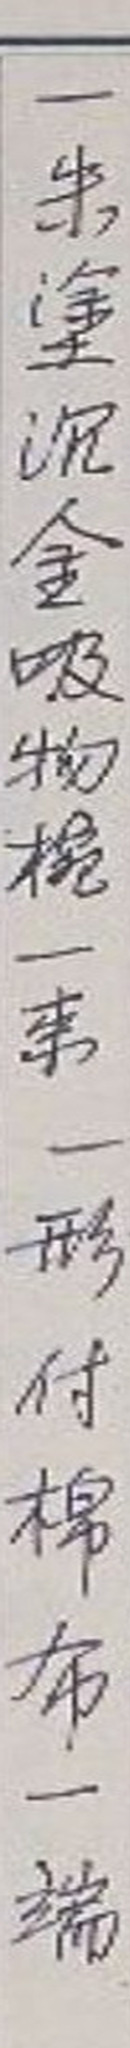一朱塗沈金吸物椀一束一形付木棉布一端
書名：支那冊封使来琉諸記 下巻
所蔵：University of the Ryukyus Library
